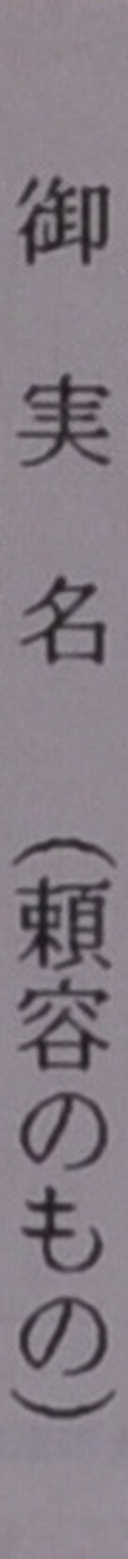御実名(頼容のもの)

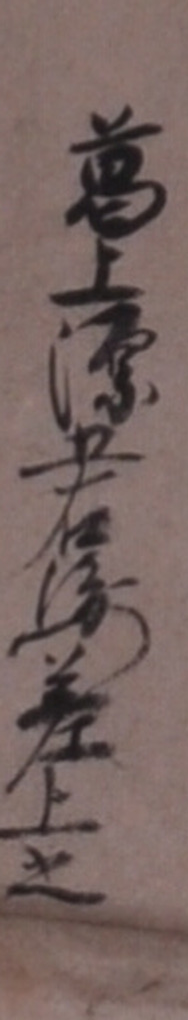葛上源五右衛門差上之

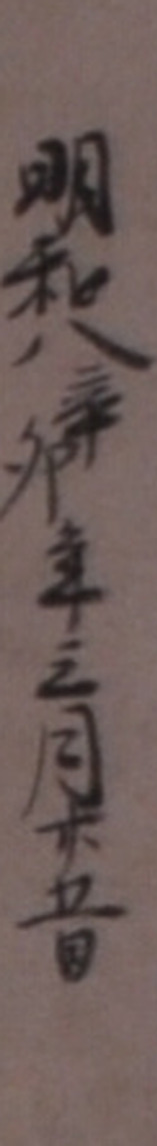明和八辛卯年三月廿五日
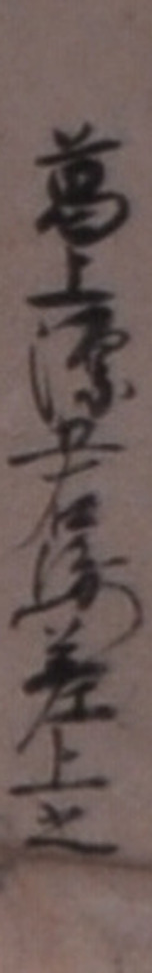葛上源五右衛門差上之

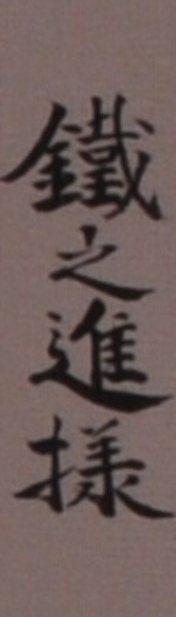鉄之進様
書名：御名目録
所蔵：伊那市立高遠町図書館・合同会社AMANE
